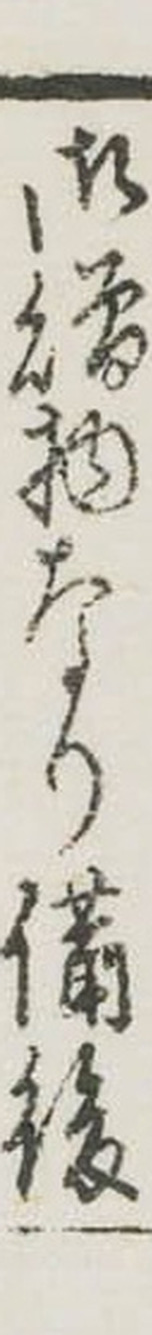御贈物なり備後
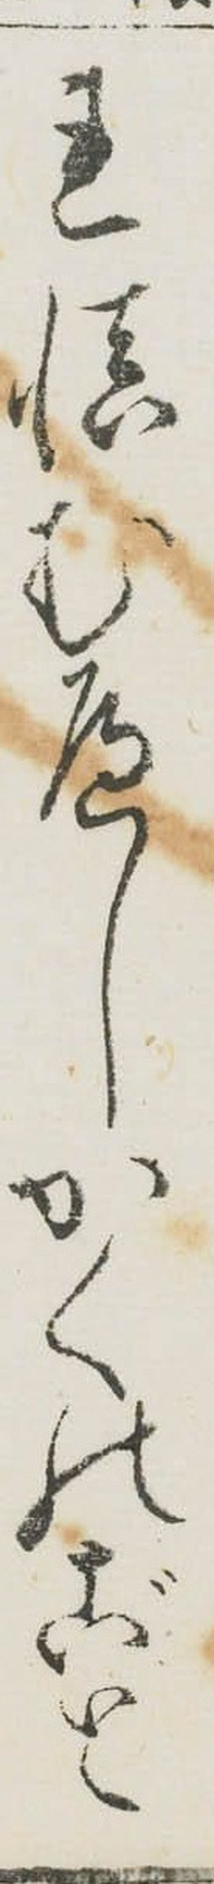れ慎むへしかくのごと
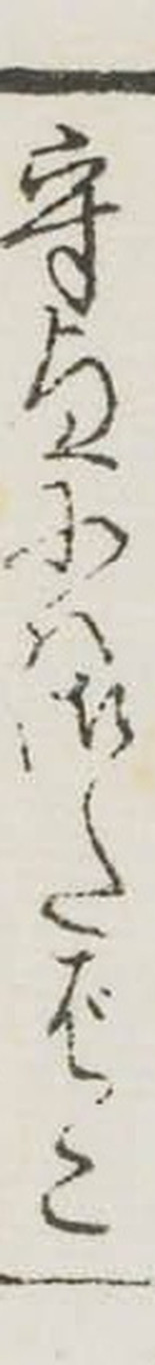守さまには御たばこ
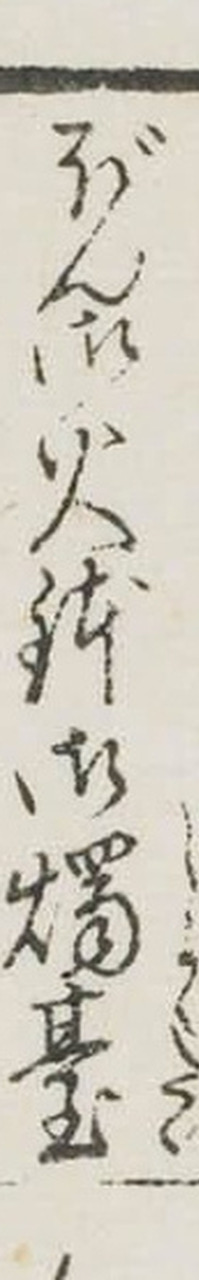ぼん御火鉢御燭台
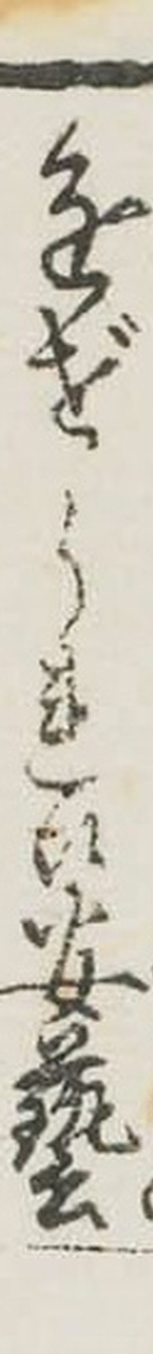進ぜられ候安藝
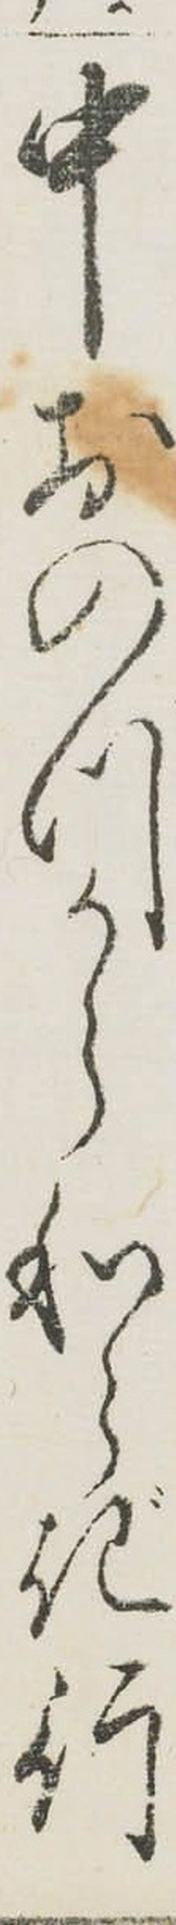中おのづから和らぎ行
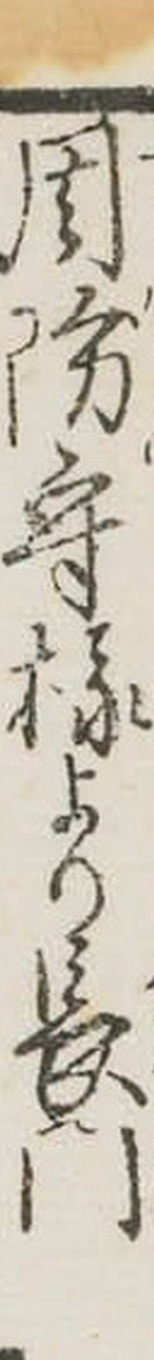周防守様より長門
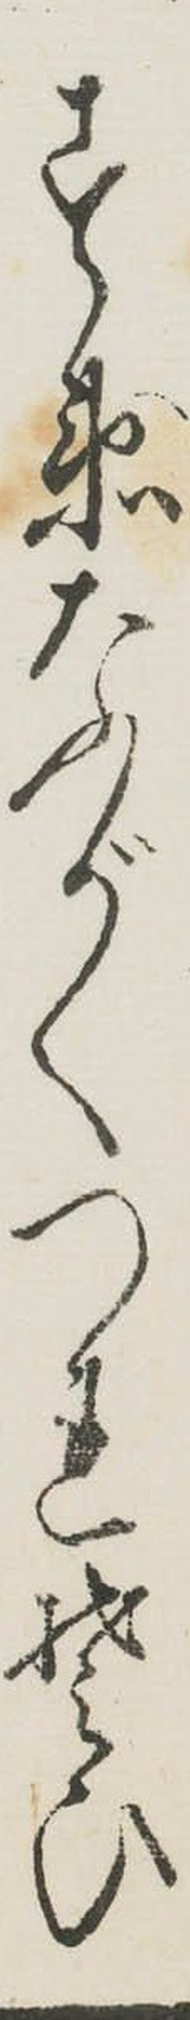すゑながくつれそひ
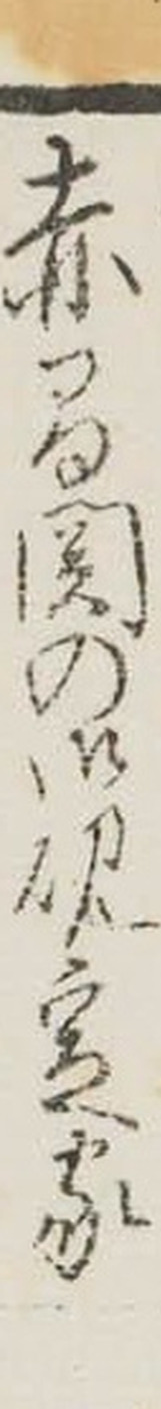赤間関の御硯定家
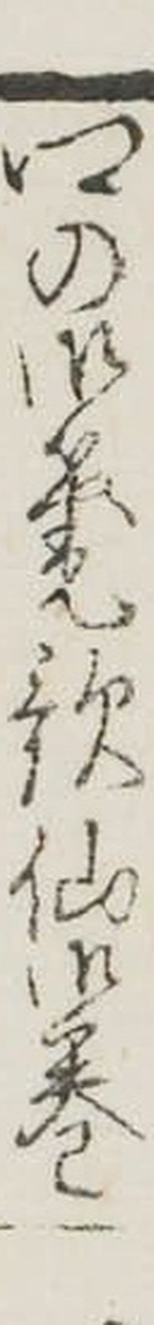卿の御筆歌仙御巻
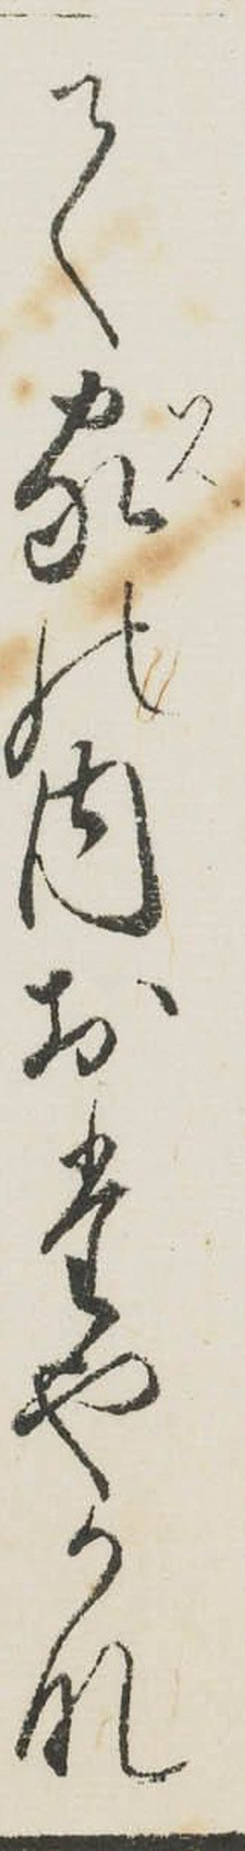て家の内おたやかな
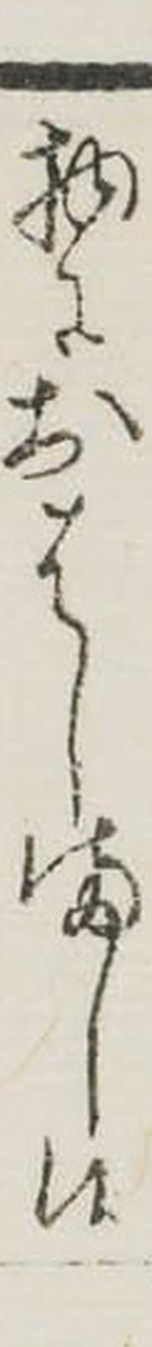物におはしまし候
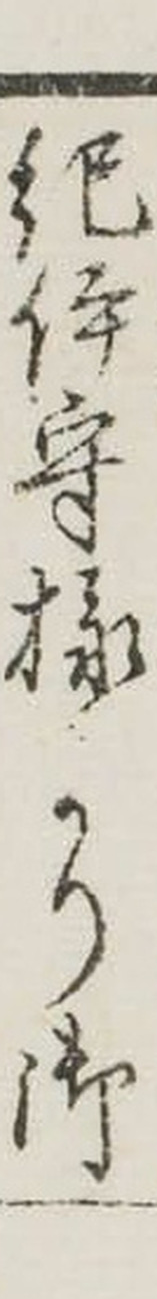紀伊守様より御
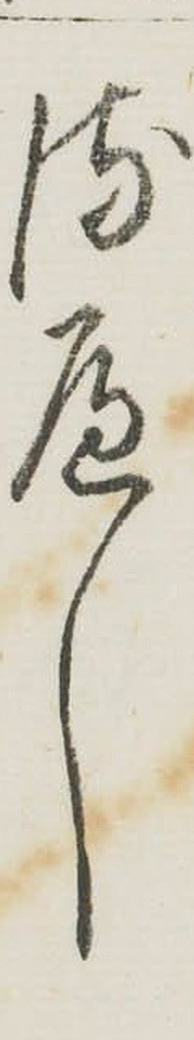るへし
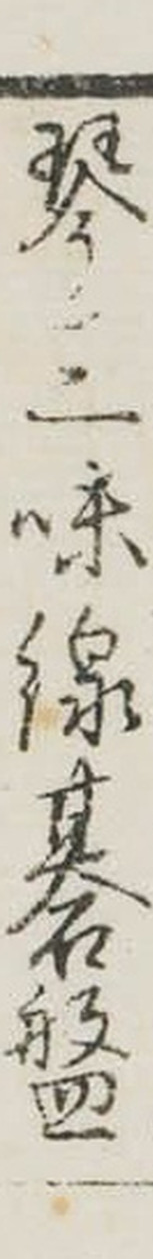琴三味線碁盤
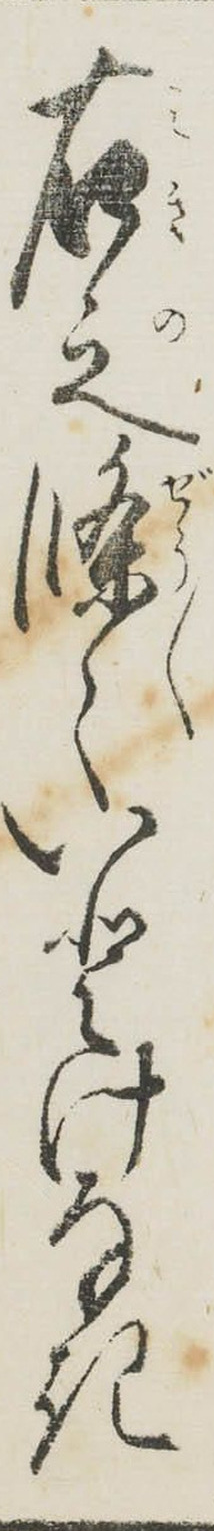右之條々いとけなき
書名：女大学
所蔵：東京学芸大学教育コンテンツアーカイブ
